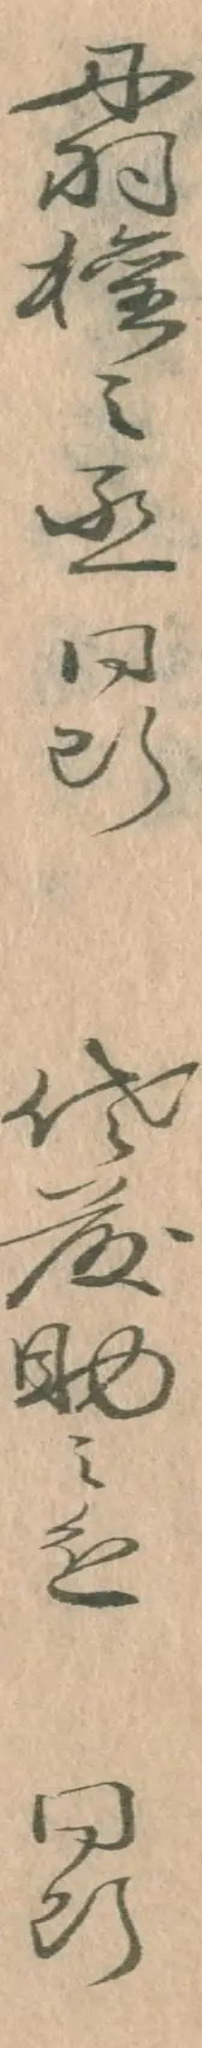丹羽権之丞同断佐藤助之進同断
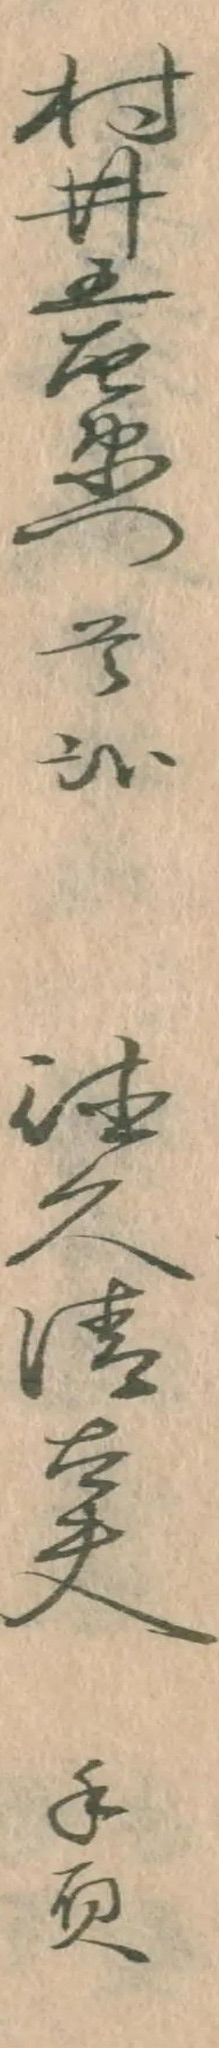村井五左衛門首弐徳久清太夫手負
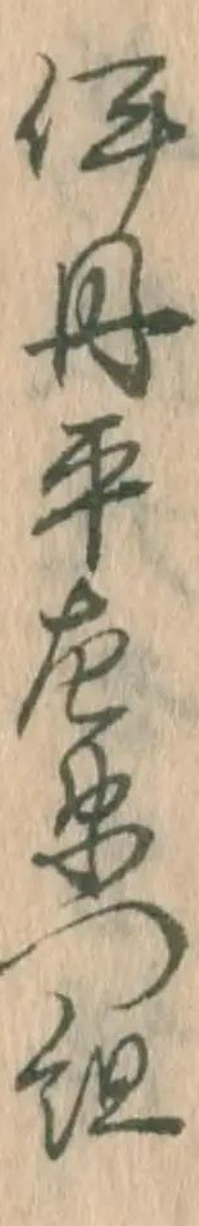伊丹平左衛門組
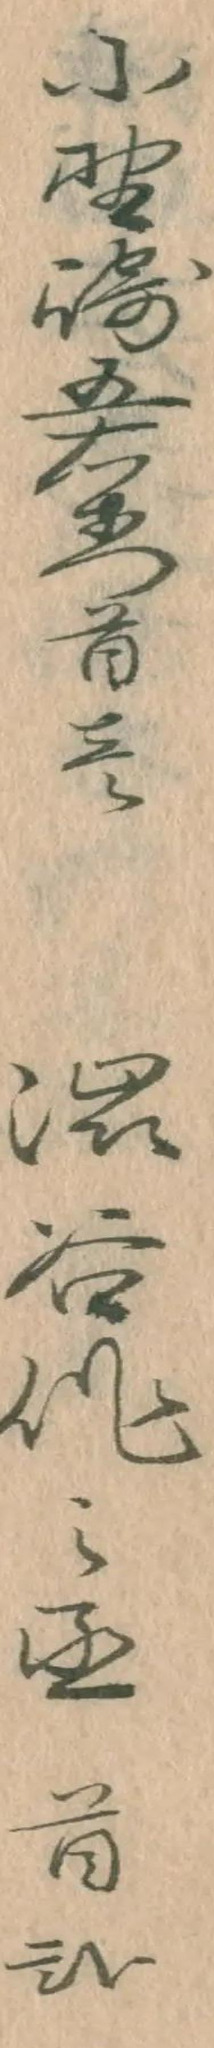小野崎五右衛門首壱渋谷作之丞首弐
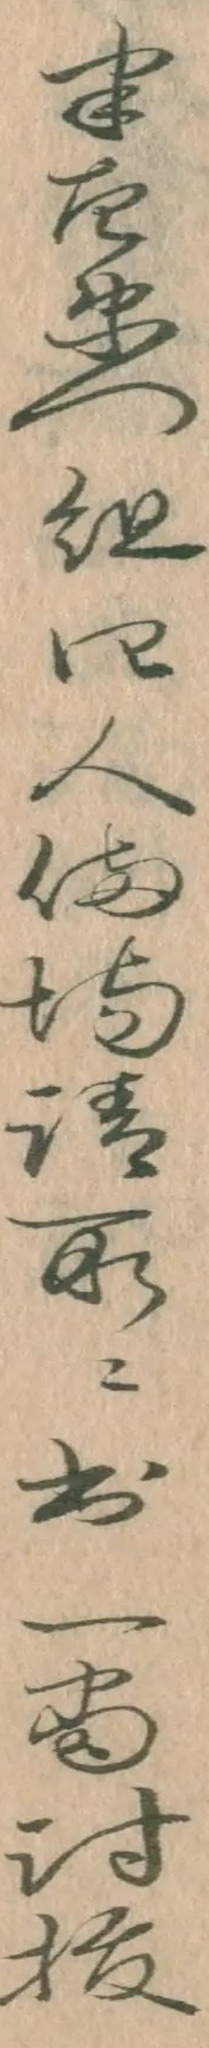半左衛門組四人備場請取に出一番討抜
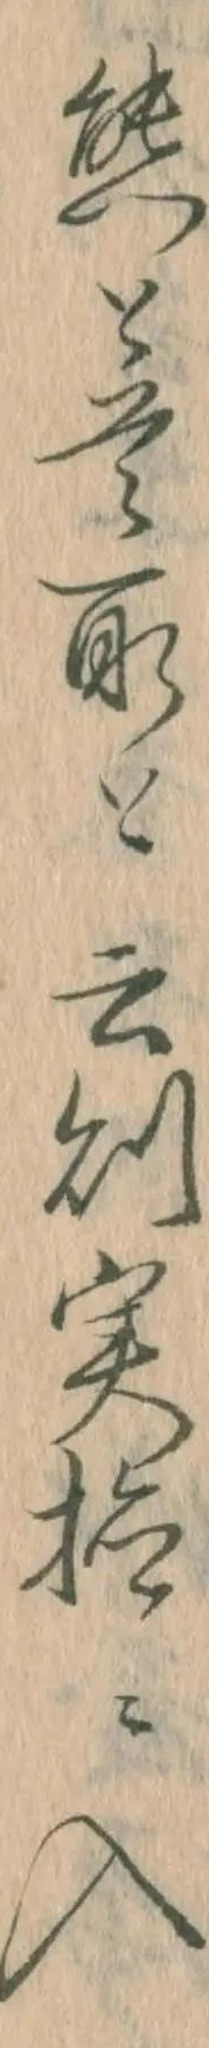熊と首取と云則実拾に入
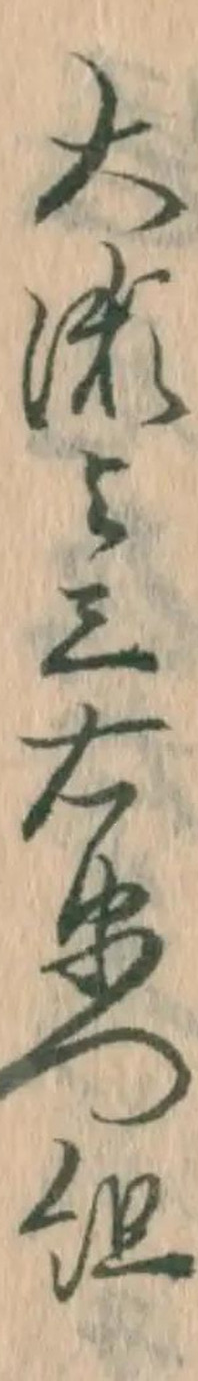大瀬予与三右衛門組
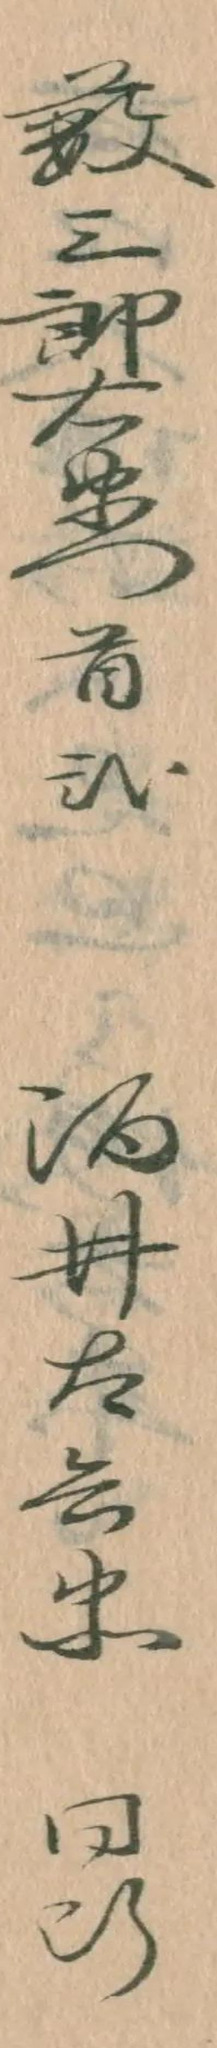藪三郎右衛門首弐酒井太兵衛同断
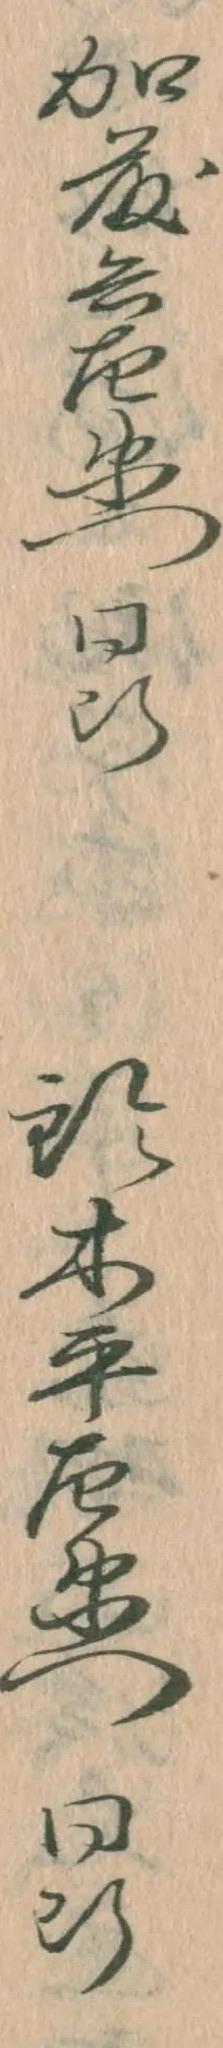加藤兵左衛門同断鈴木平左衛門同断
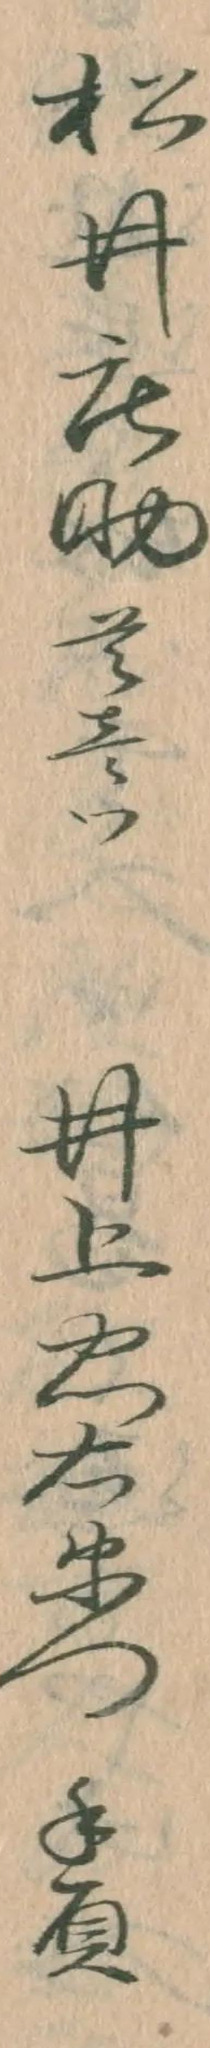松井庄助首壱つ井上忠右衛門手負
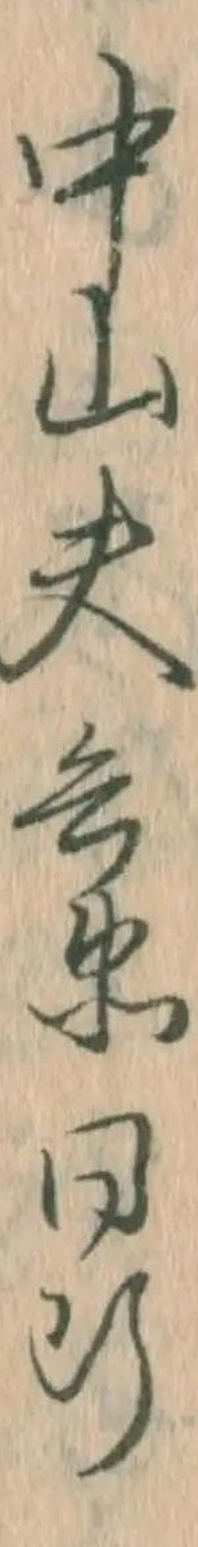中山夫兵衛同断
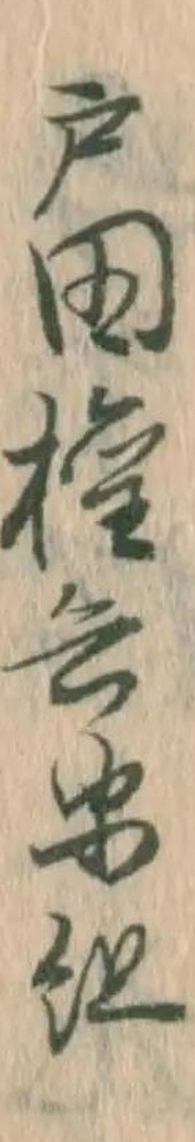戸田権兵衛組
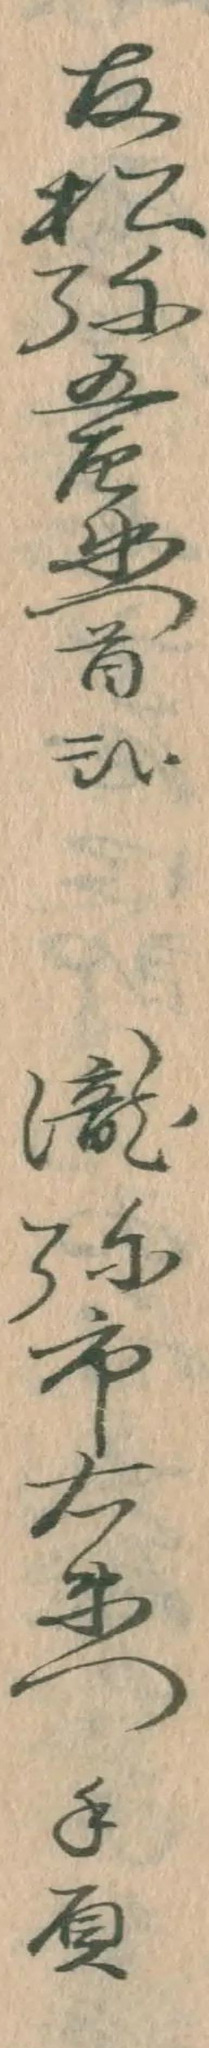友松弥五左衛門首弐瀧弥市右衛門手負
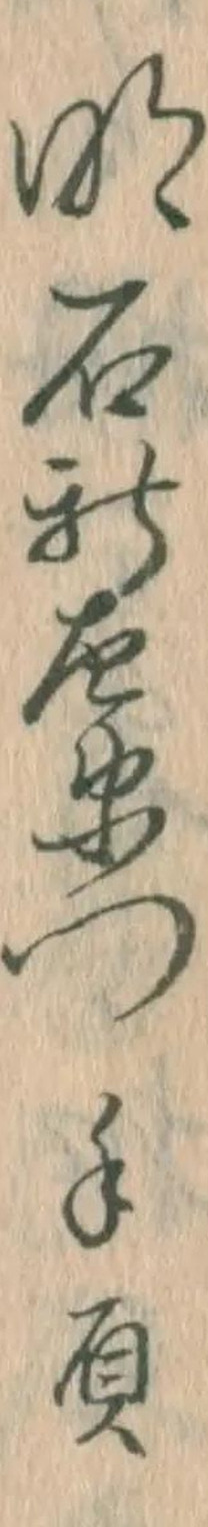明石新左衛門手負
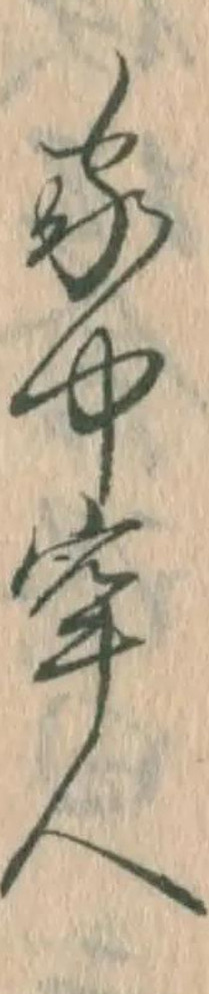家中牢人
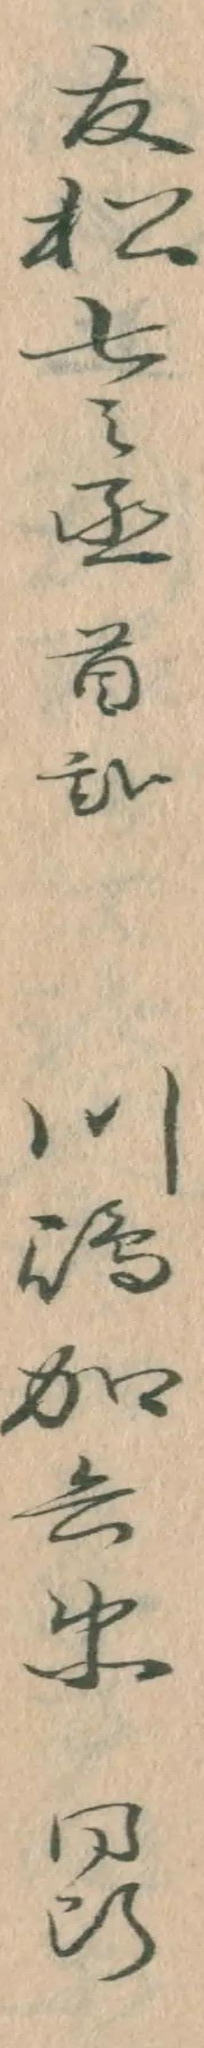友松七之丞首弐川島加兵衛同断
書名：切支丹御退治記 49巻. [9]
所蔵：国立国会図書館 National Diet Library, JAPAN
